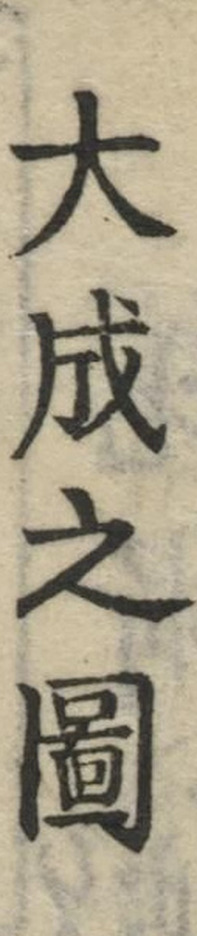大成之図
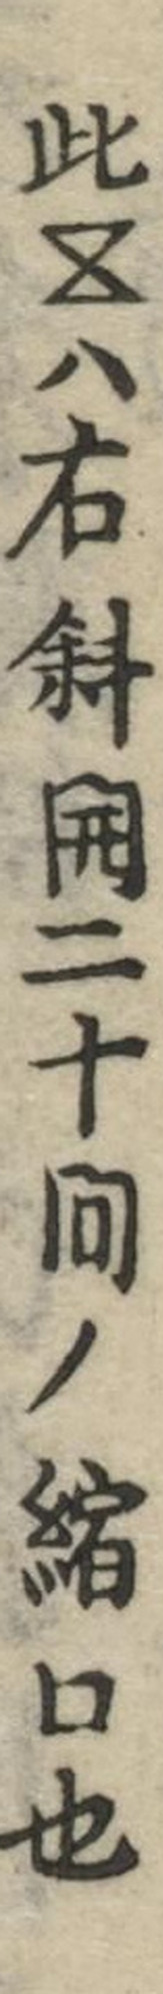此▽△ハ右斜開二十間ノ縮口也
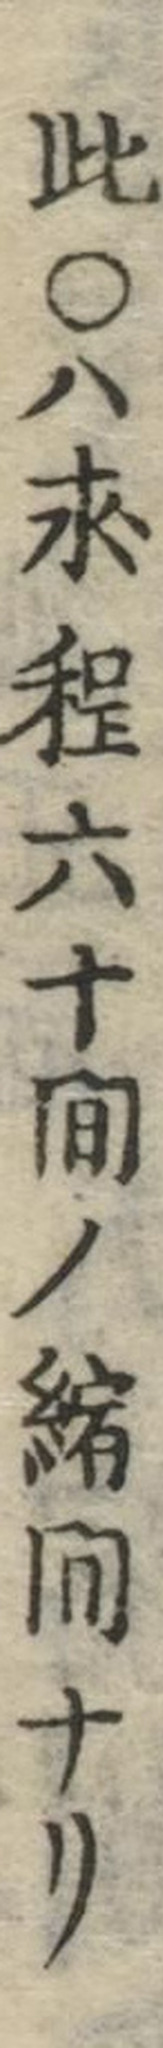此○ハ求程六十間ノ縮間ナリ
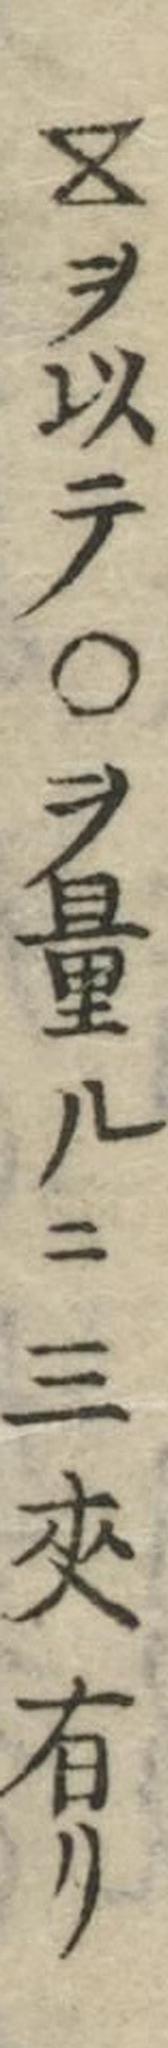▽△ヲ以テ○ヲ量ルニ三夾有リ
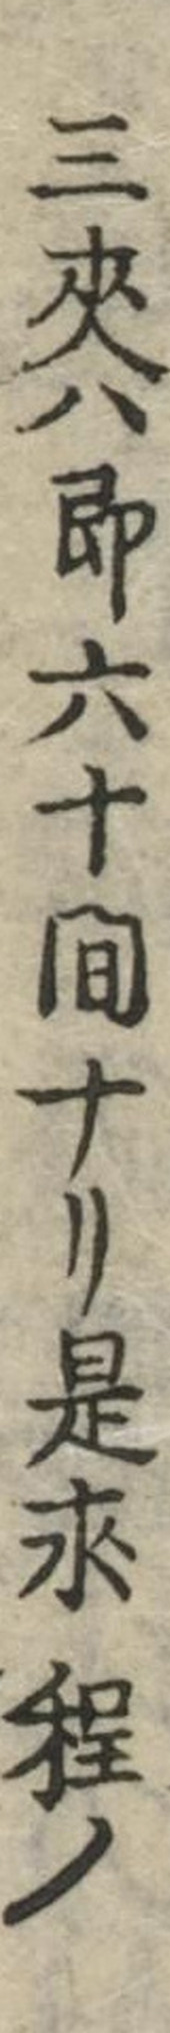三夾ハ即六十間ナリ是求程ノ
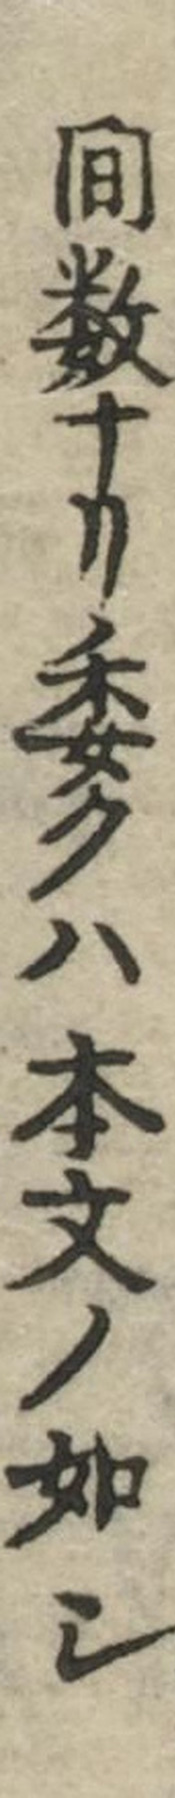間数ナリ委クハ本文ノ如シ

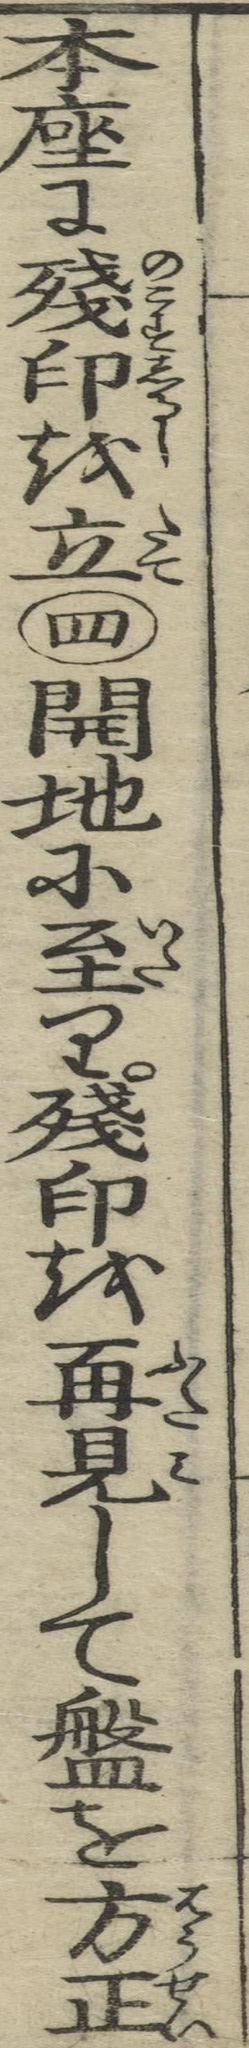本座に残印を立㊃開地に至り。残印を再見して盤を方正
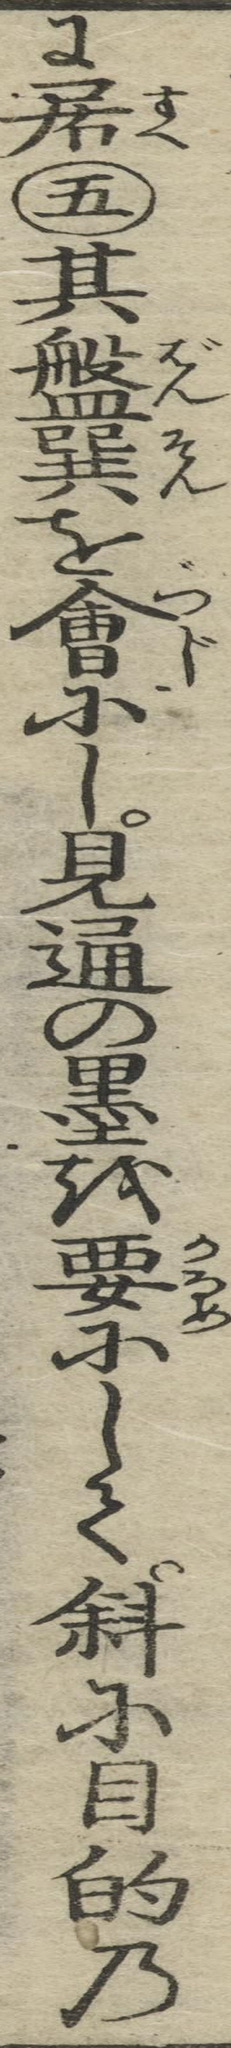に居㊄其盤巽を會にし。見通の墨を要にして。斜に目的の
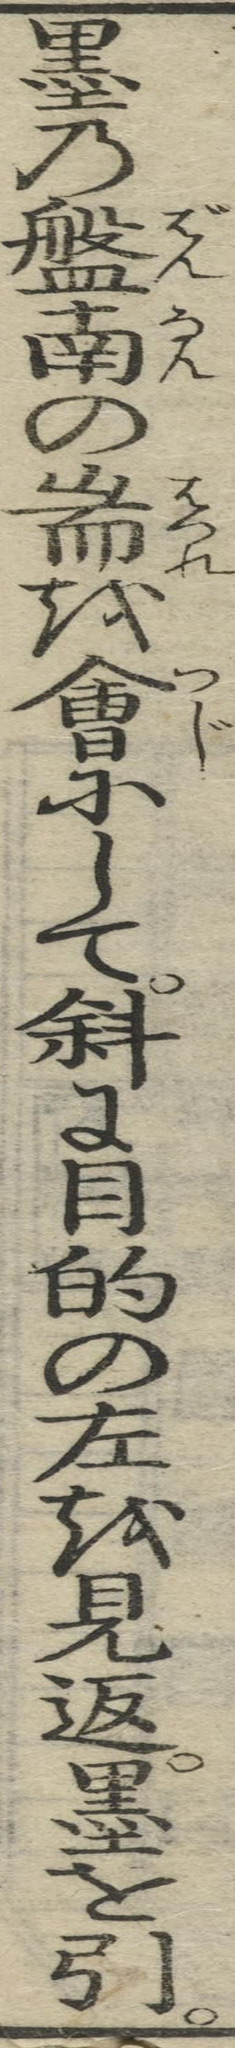墨の盤南の耑を會にして。斜に目的の左を見返。墨を引。
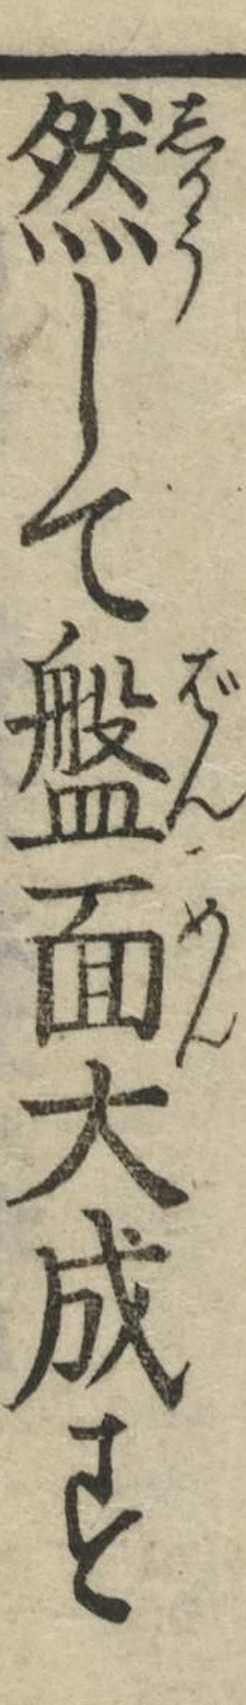然して盤面大成す
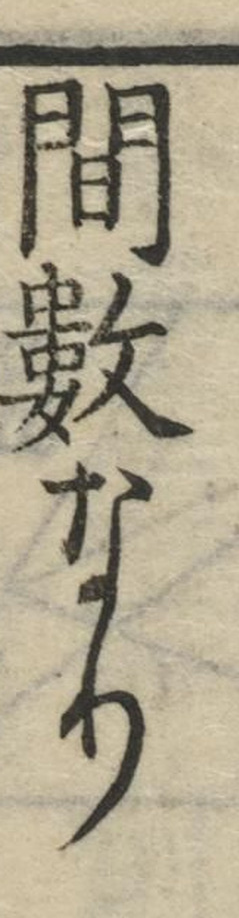間数なり
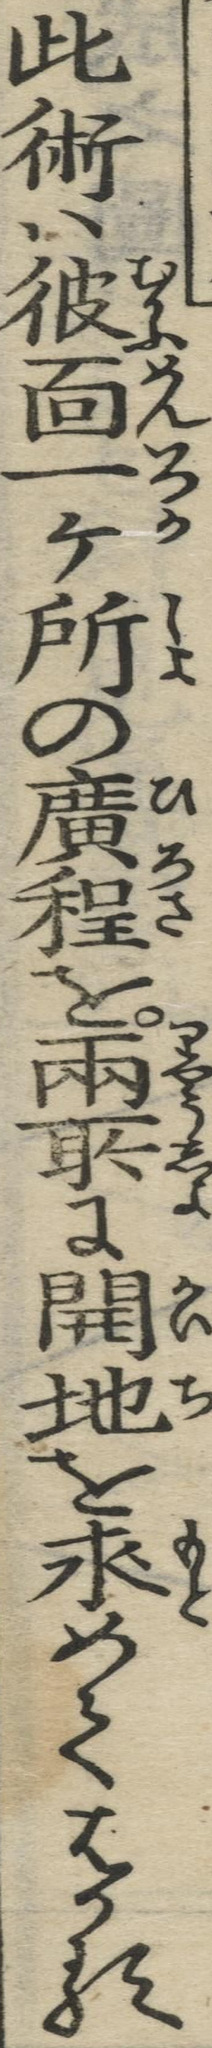此術は彼面一ヶ所の広程を。両所に開地を求めてはかる
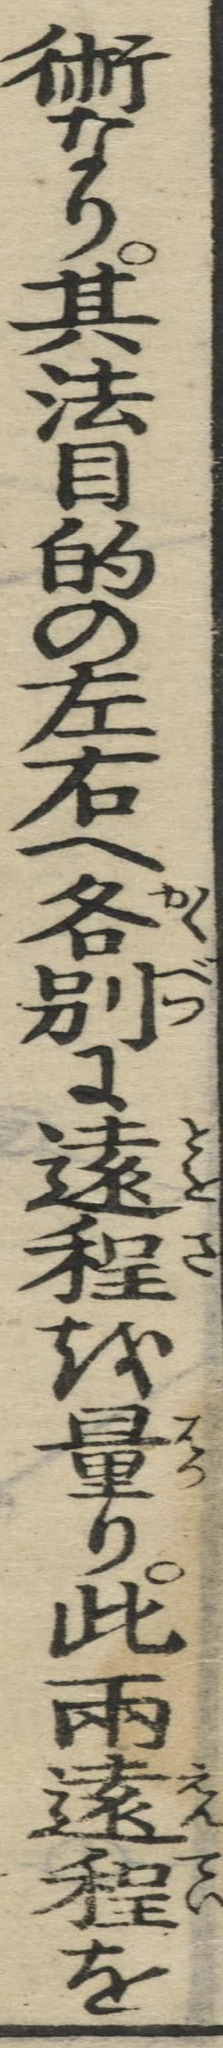術なり。其法目的の左右へ各別に遠程を量り。此両遠程を
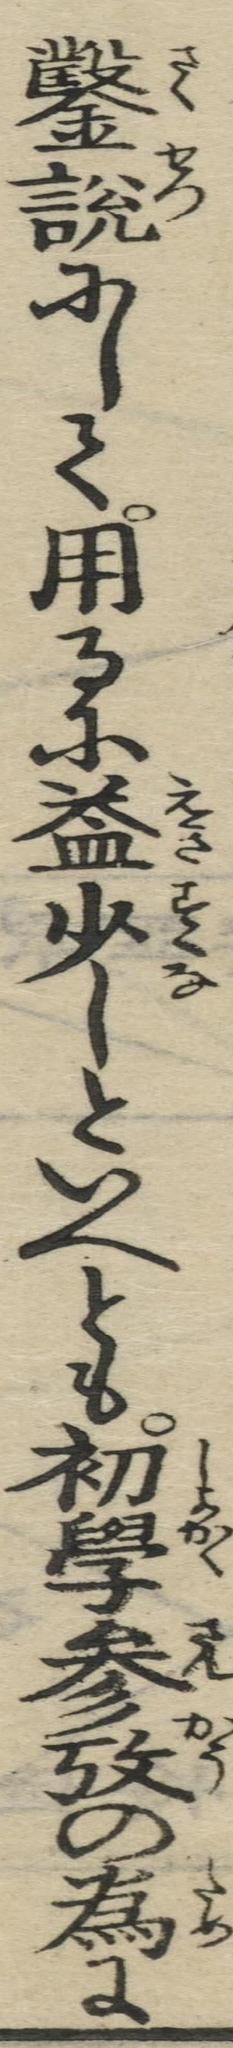鑿説にして。用るに益少しといへとも。初学参考の為に

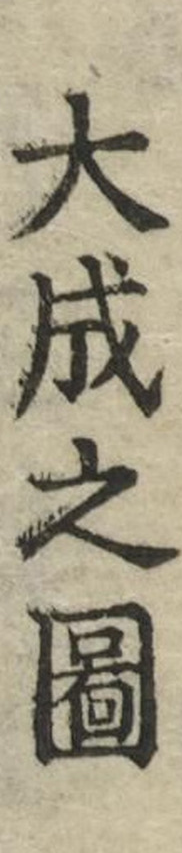大成之図
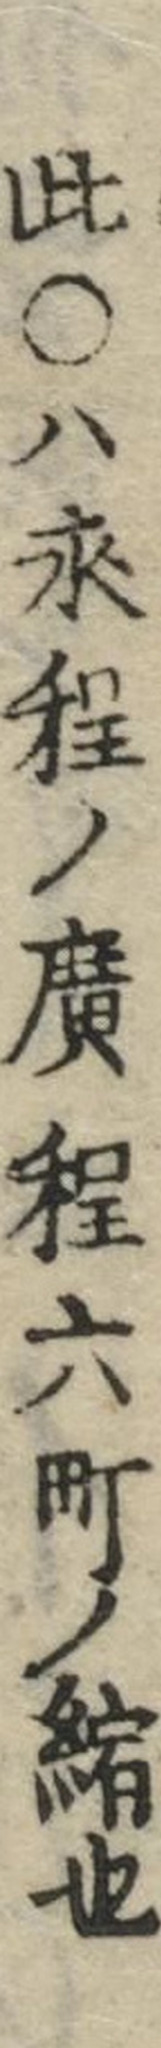此○ハ来程ノ広程六町ノ縮也六
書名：量地指南　巻之三（内題）
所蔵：東京大学地震研究所図書室 Earthquake Research Institute Library, The University of Tokyo, JAPAN
